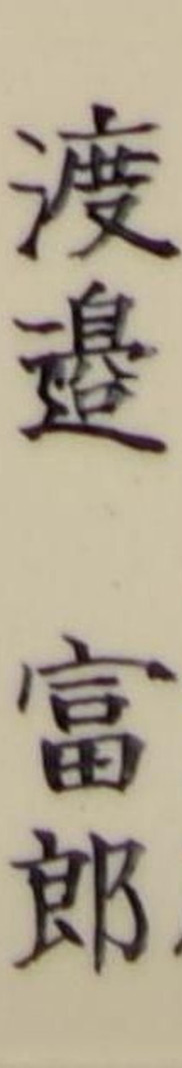渡辺富郎
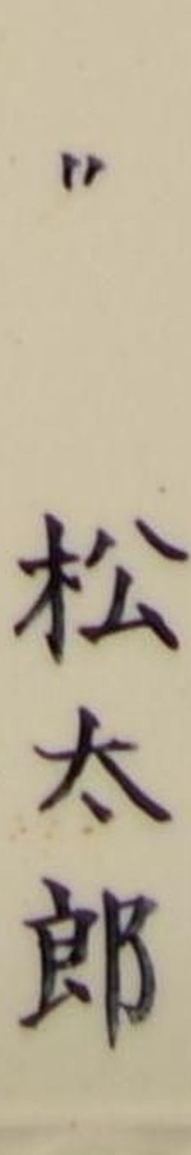松太郎
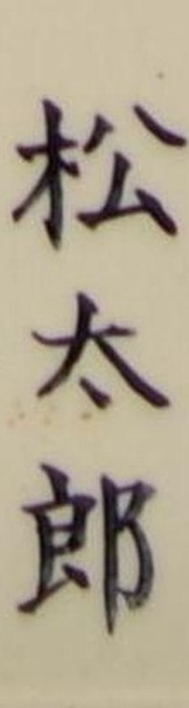松太郎
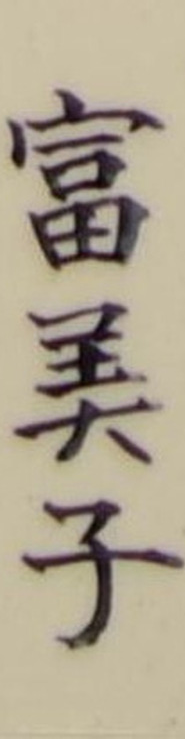富美子
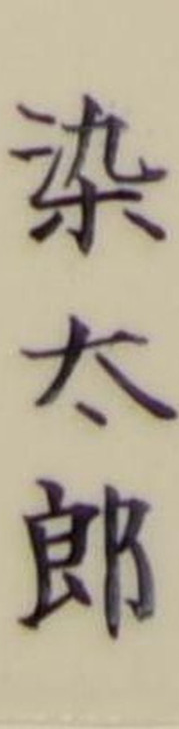染太郎

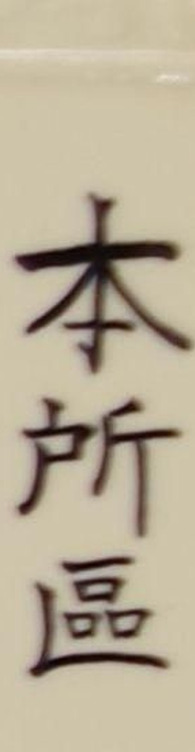本所区
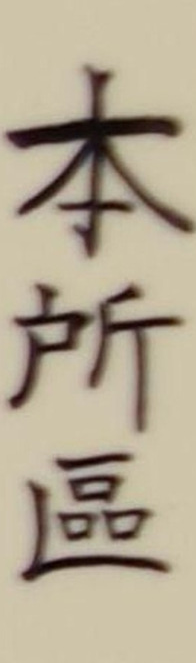本所区
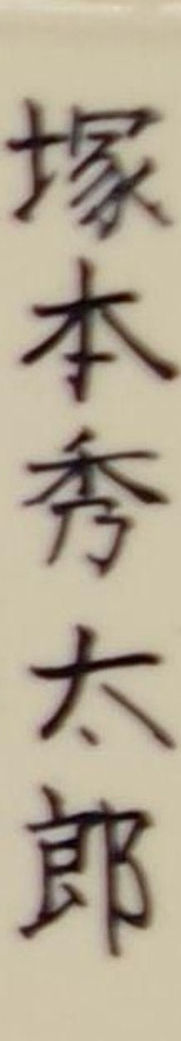塚本秀太郎
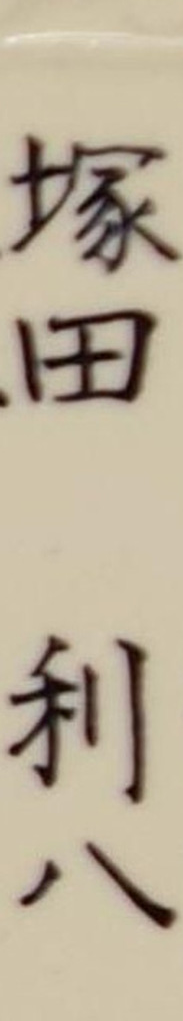塚田利八
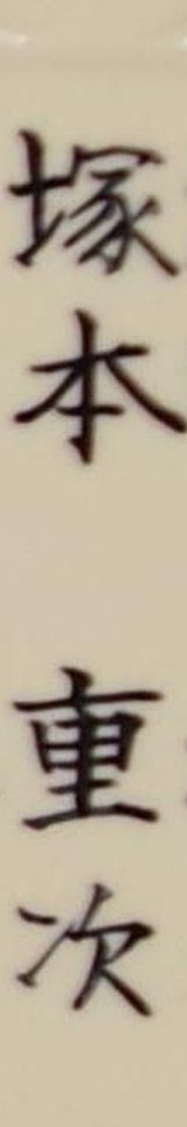塚本重次
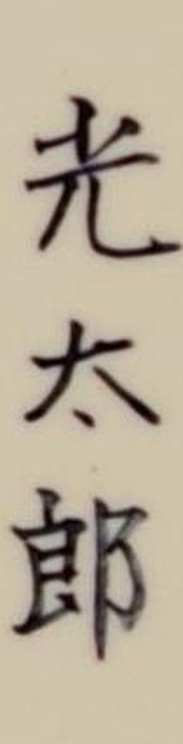光太郎
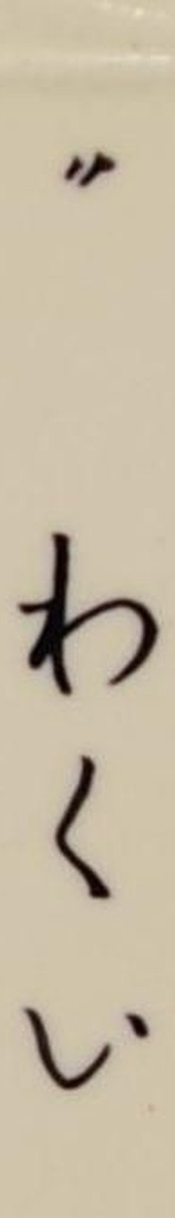わくい
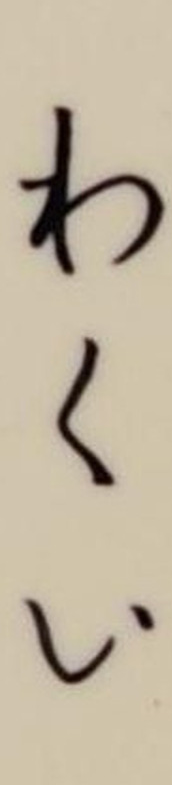わくい
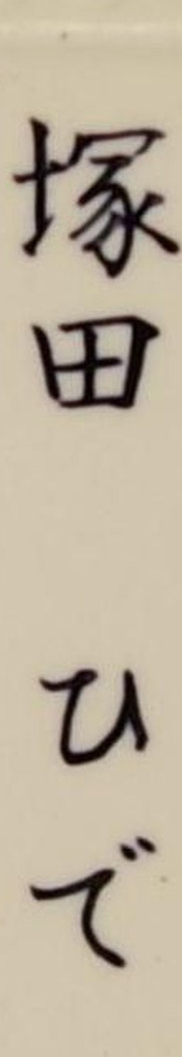塚田ひで
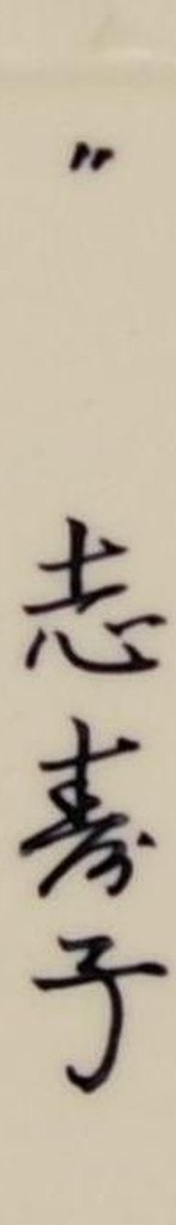志寿子
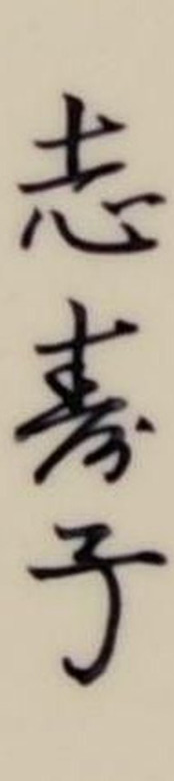志寿子
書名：E~L
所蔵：高野山金剛峯寺
